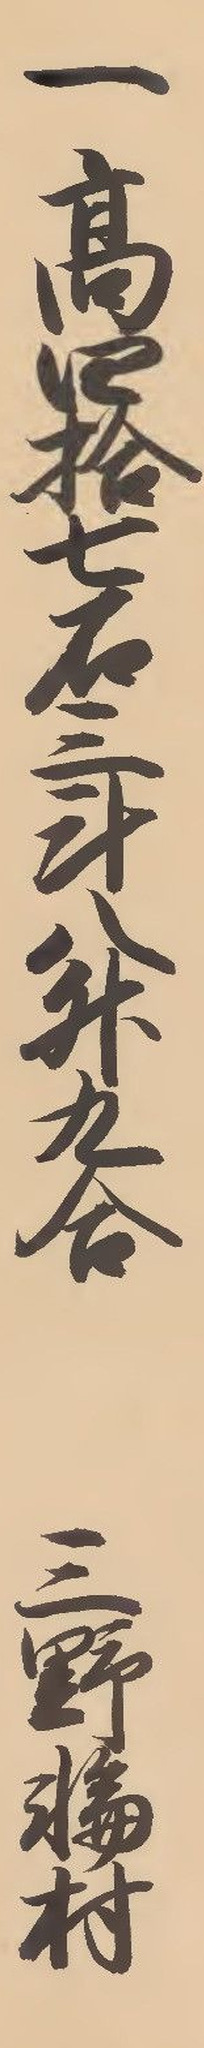一高四拾七石三斗八升九合三野輪村

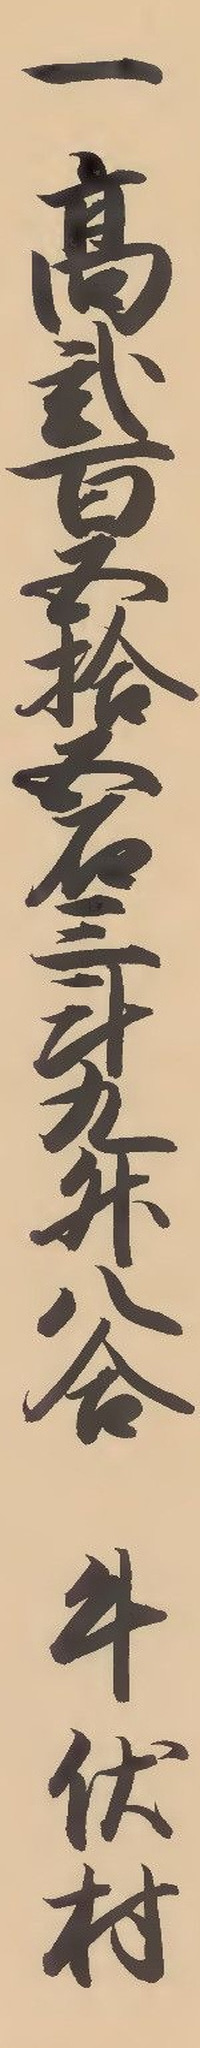一高弐百五拾五石三斗九升八合牛伏村
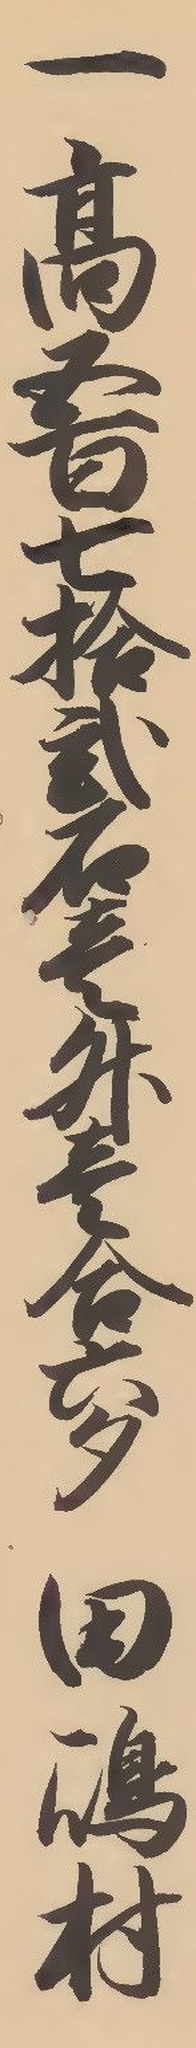一高五百七拾弐石壱升壱合六勺田島村
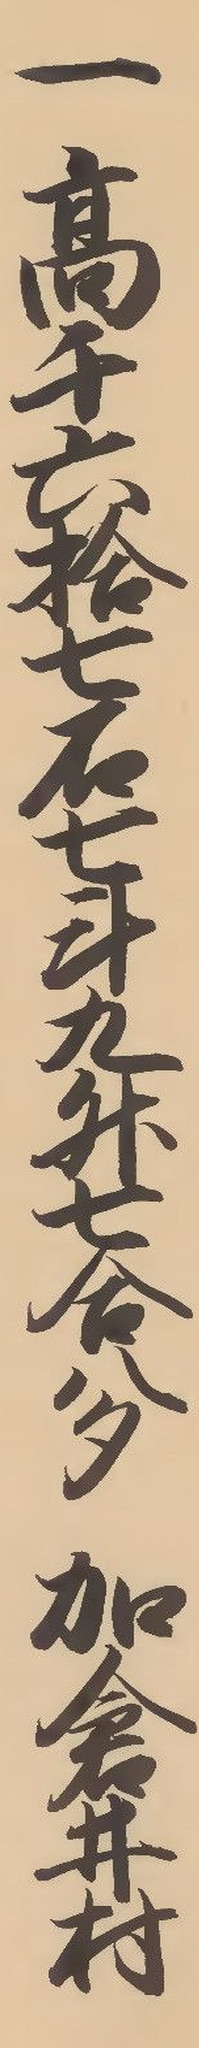一高千六拾七石七斗九升七合八勺加倉井村
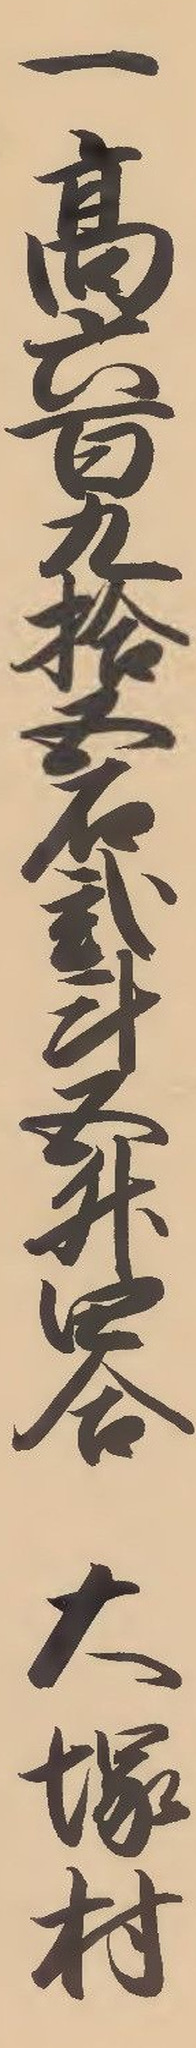一高六百九拾五石弐斗五升四合大塚村
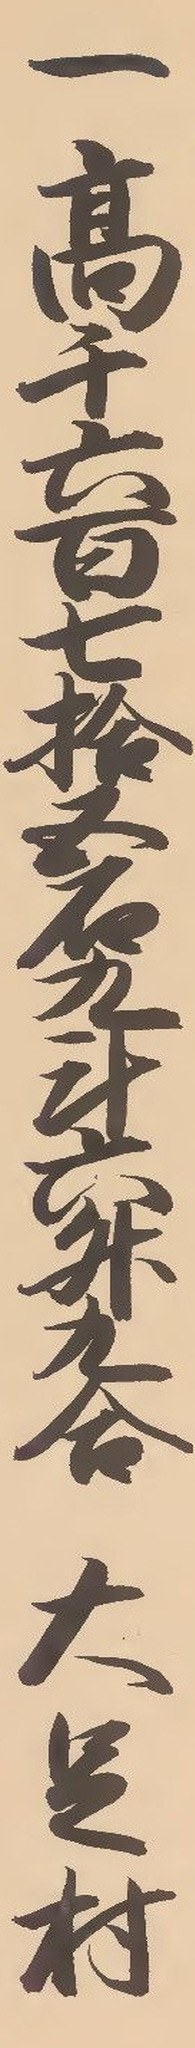一高千六百七拾五石九斗六升九合大足村
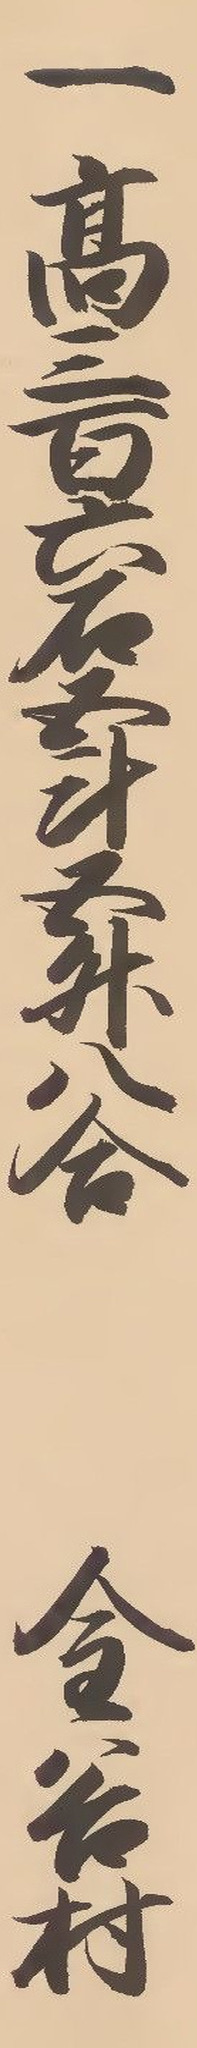一高三百六石五斗五升八合金谷村
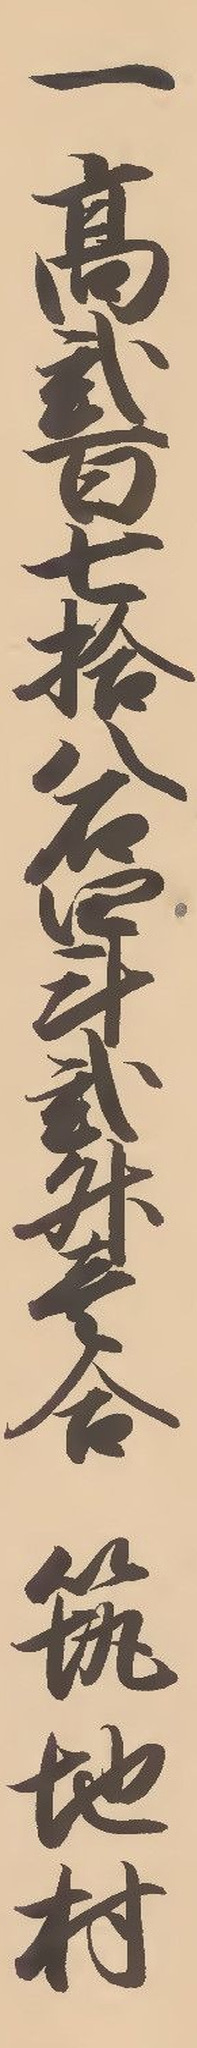一高弐百七拾八石四斗弐升壱合筑地村
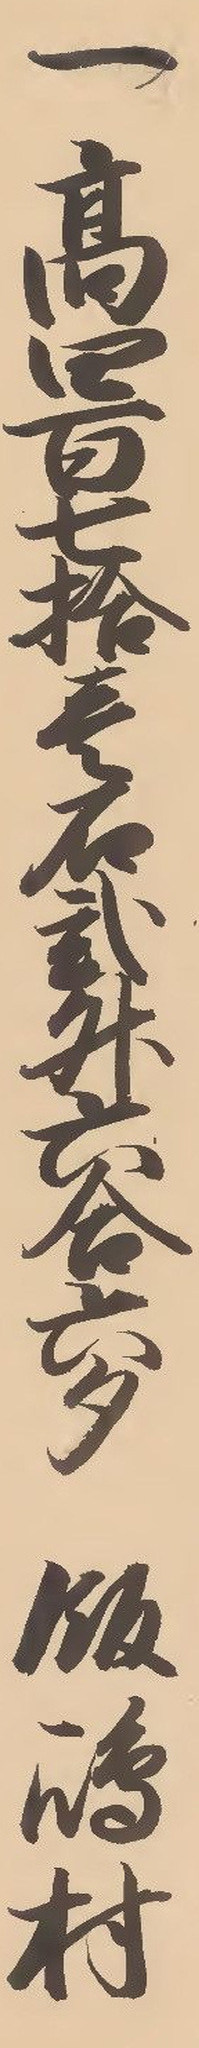一高四百七拾壱石弐升六合六勺飯島村

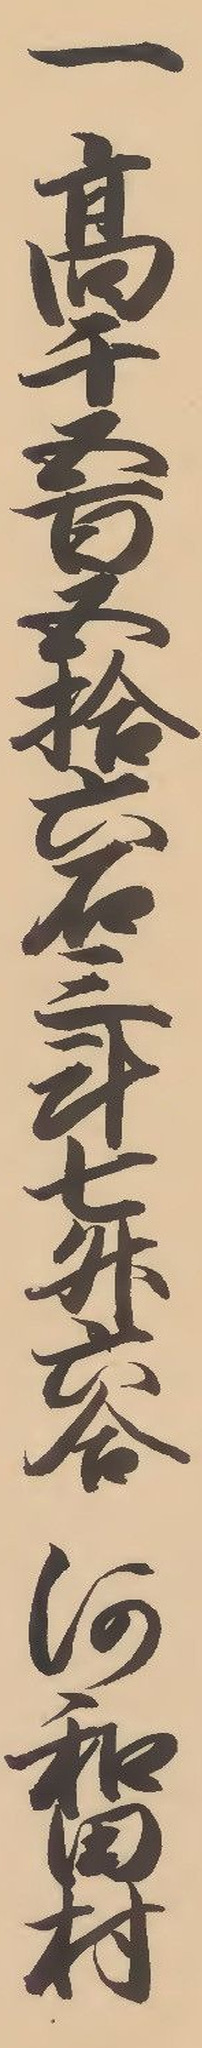一高千五百五拾六石三斗七升六合河和田村
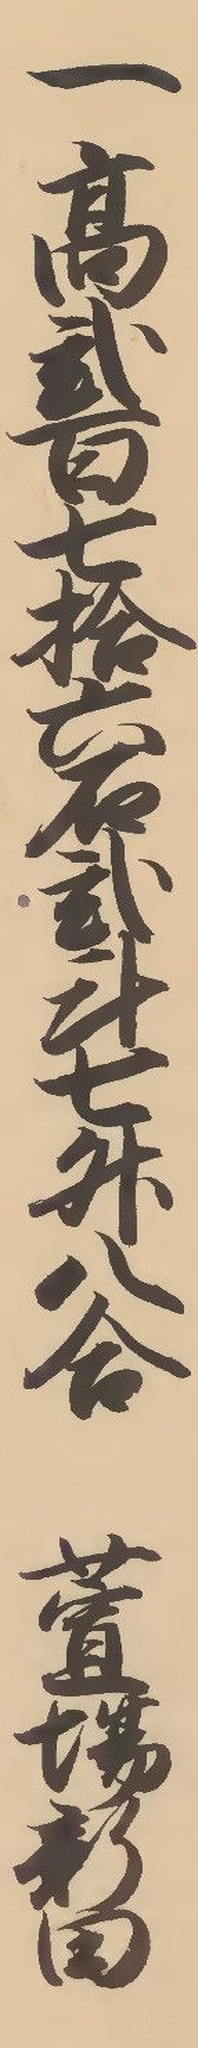一高弐百七拾六石弐斗七升八合萱場新田
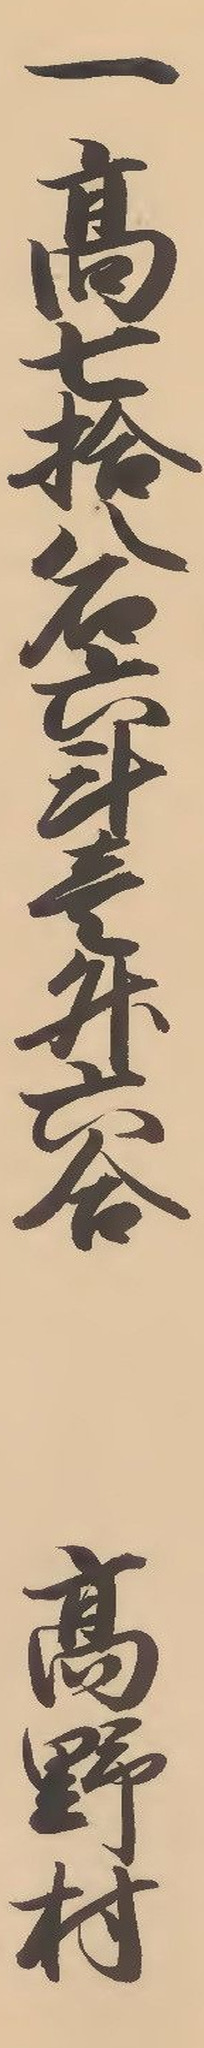一高七拾八石六斗壱升六合高野村
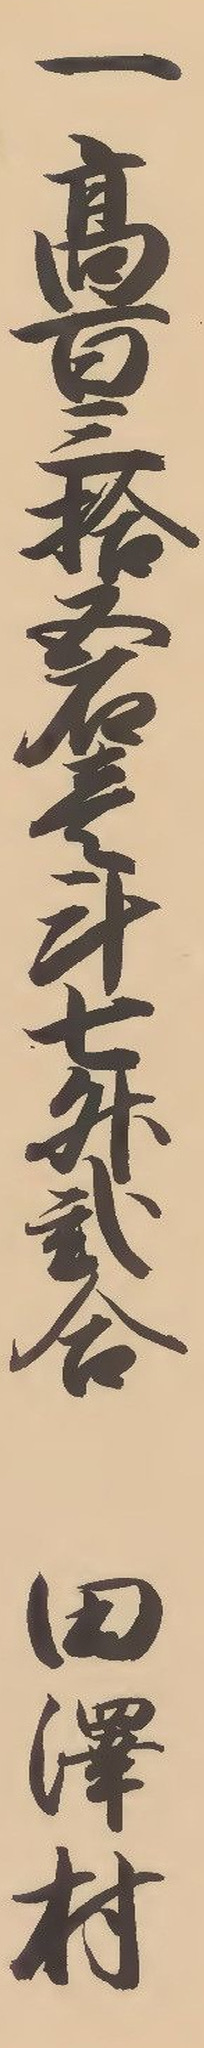一高百三拾五石壱斗七升弐合田沢村
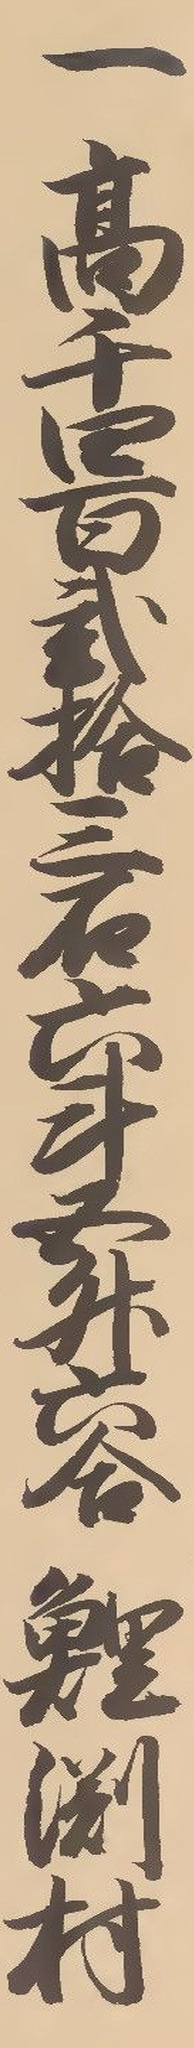一高千四百弐拾三石六斗五外六合鯉淵村
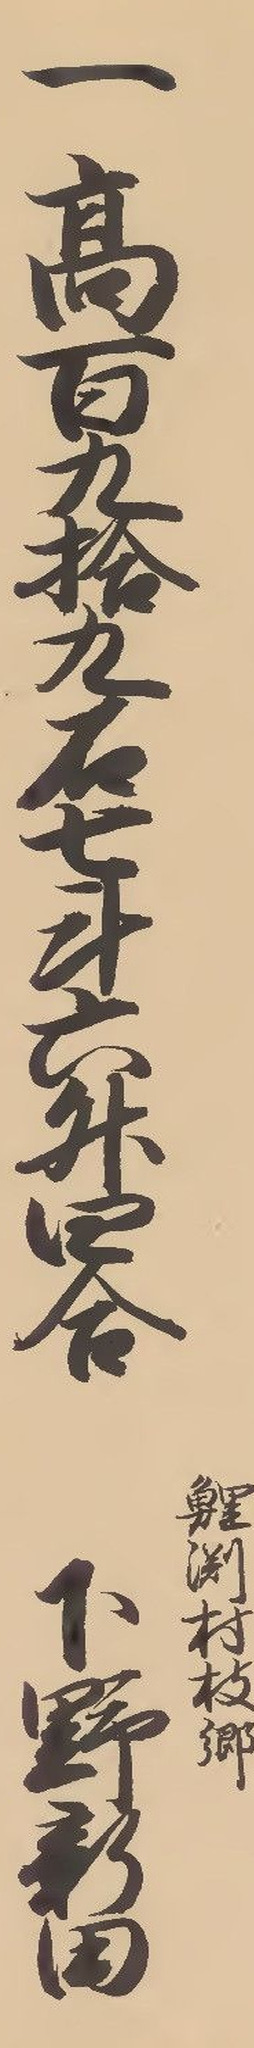一高百九拾九石七斗六升四合下野新田
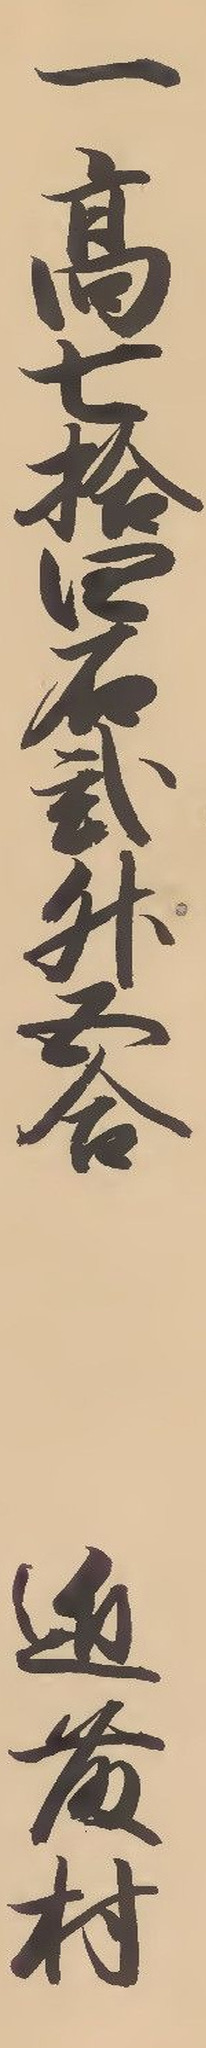一高七拾四石弐升五合近藤村
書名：常陸国郷帳
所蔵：国立公文書館 National Archives of Japan
